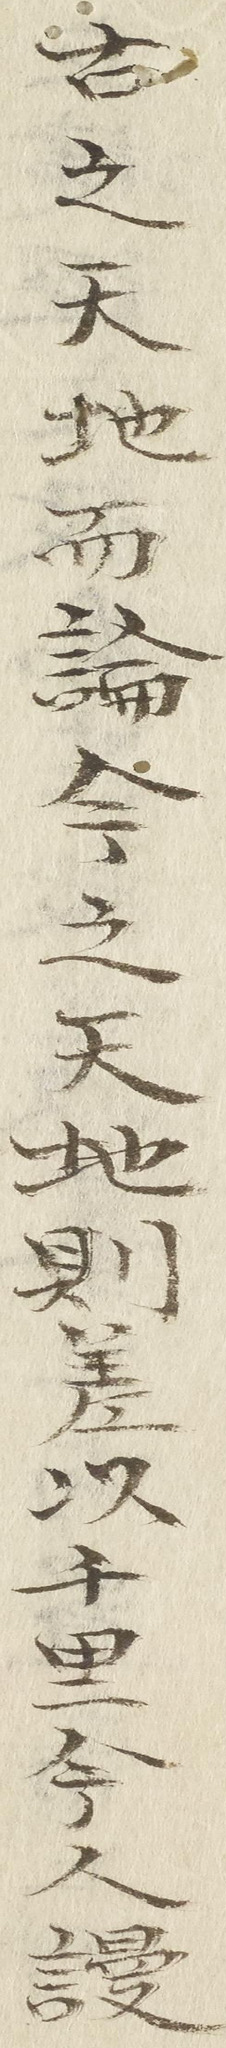古之天地而論今之天地則差以千里今人謾
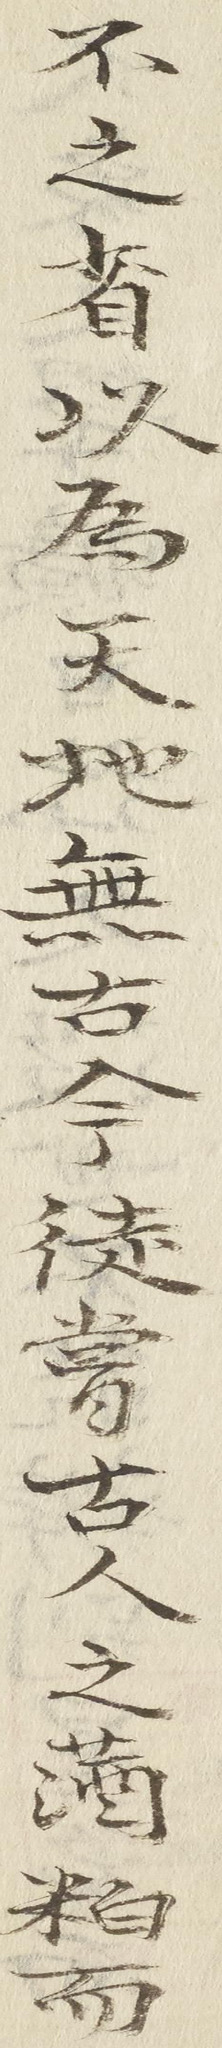不之省以為天地無古今徒甞古人之酒？粕而
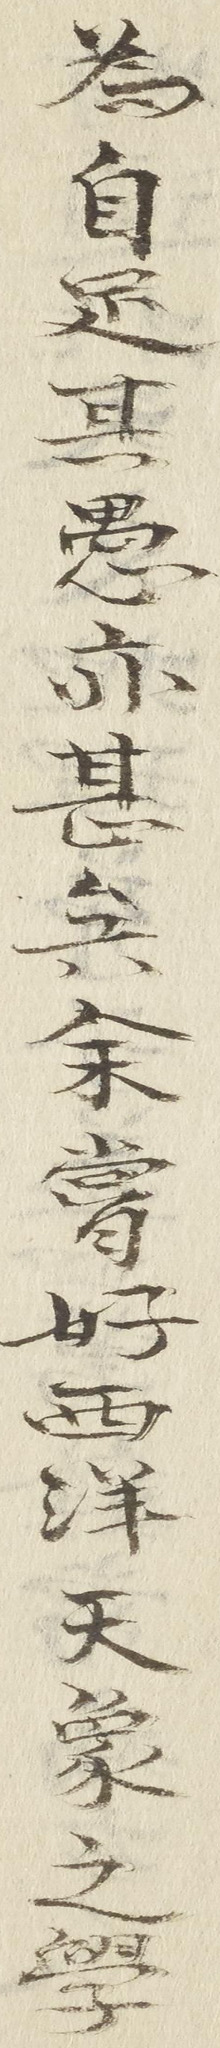為自足其愚亦甚矣余嘗好西洋天象之学
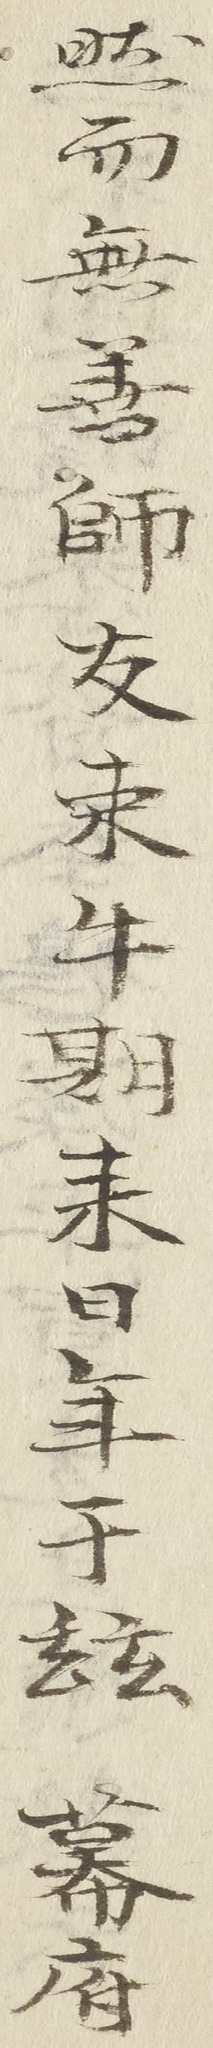然而無善師友束牛期来日年于玆幕府
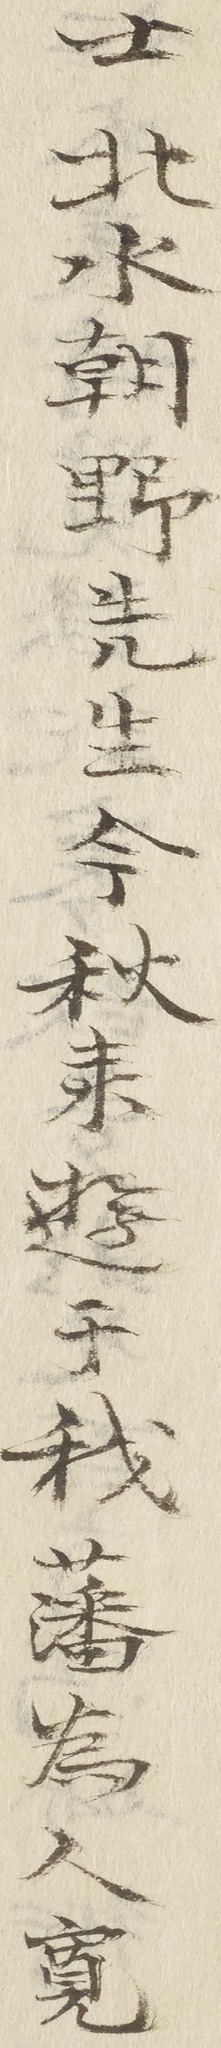士北水朝野先生今秋来遊于我藩為人寛

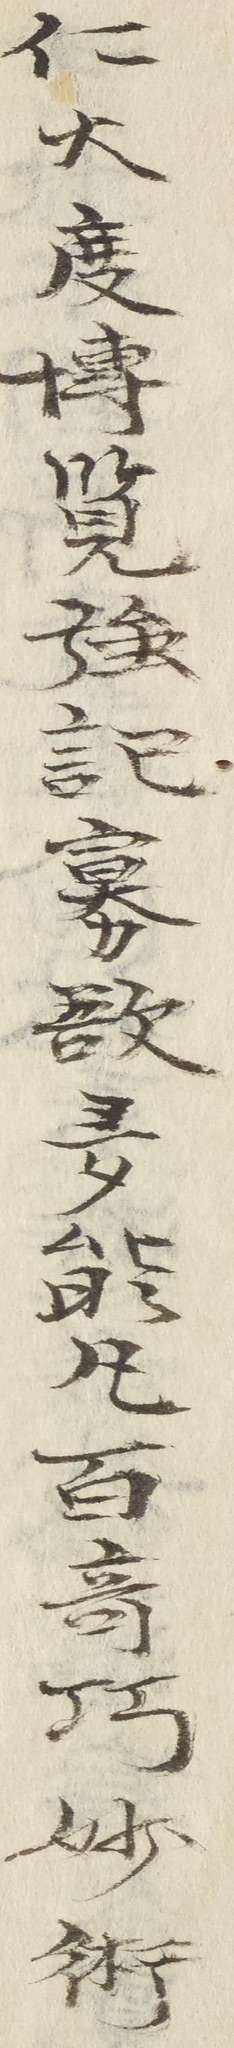仁大度博覧強記寡欲多能凡百奇巧妙術
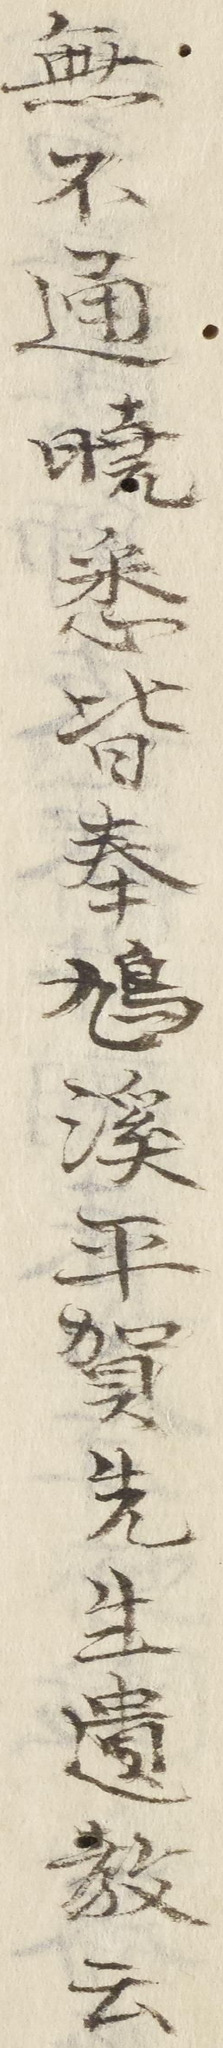無不通暁悉皆奉鳩渓平賀先生遺教云
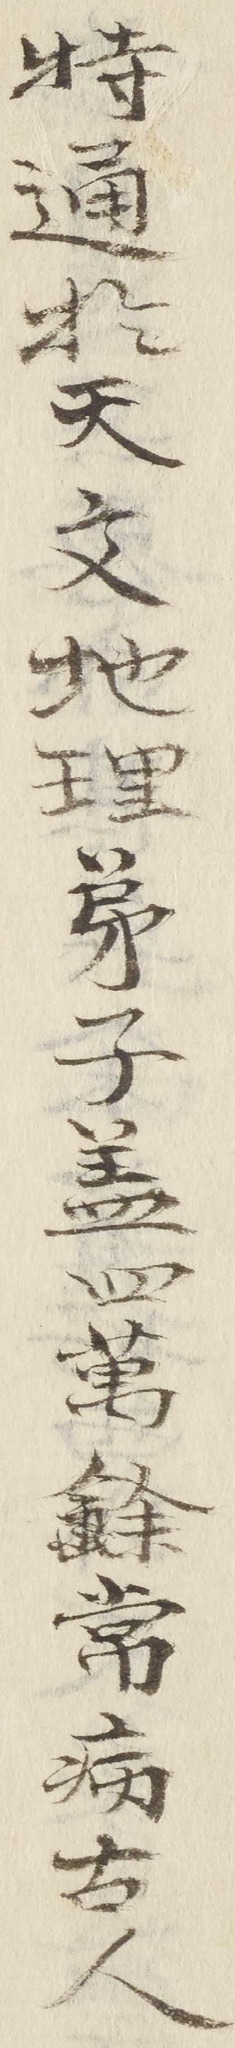特通於天文地理弟子蓋四万余常病古人
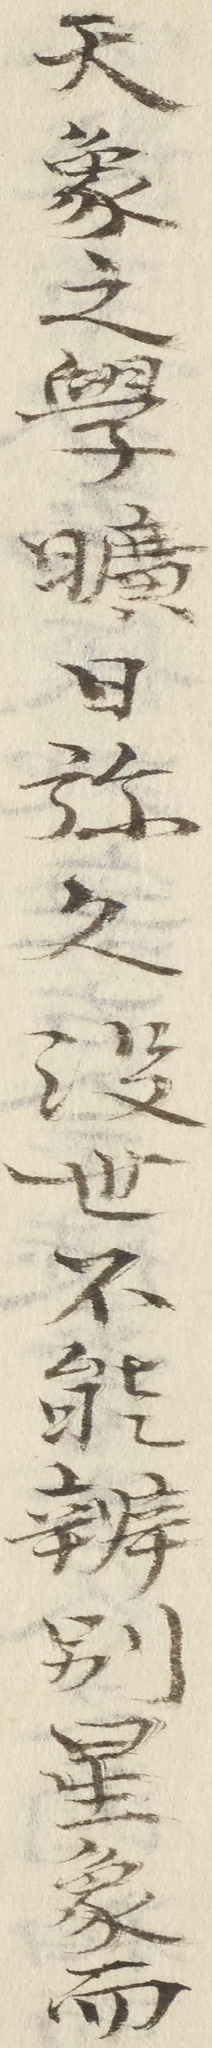天象之学曠日弥久没世不能弁別星象而
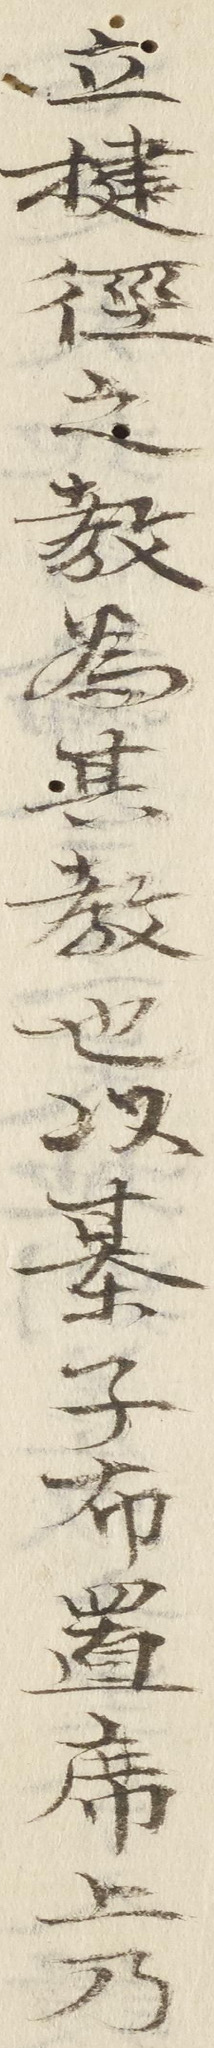立捷径之教為其教也以棋子布置席上乃
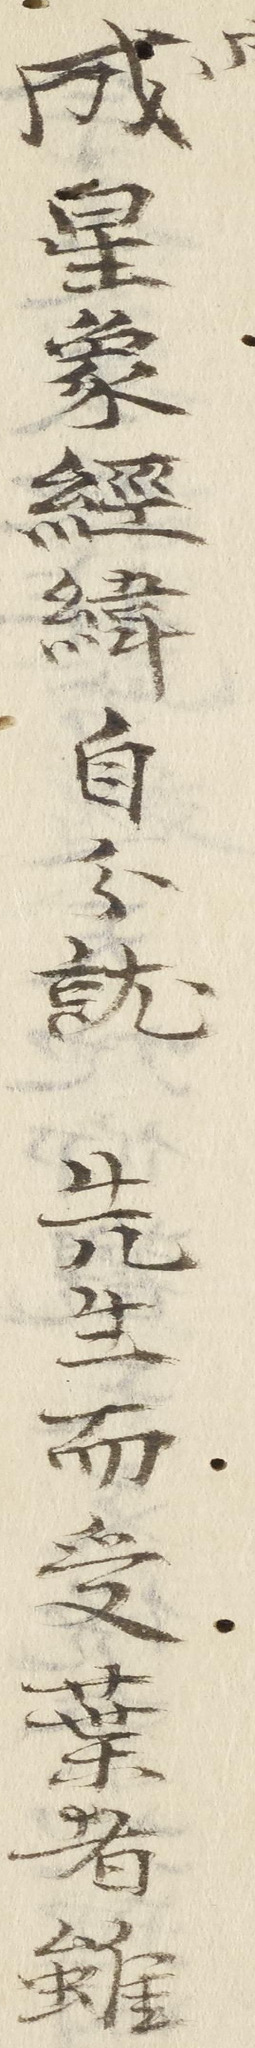成星象経緯自分就先生而受葉者雖
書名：天象話説
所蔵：東京大学地震研究所図書室 Earthquake Research Institute Library, The University of Tokyo, JAPAN
